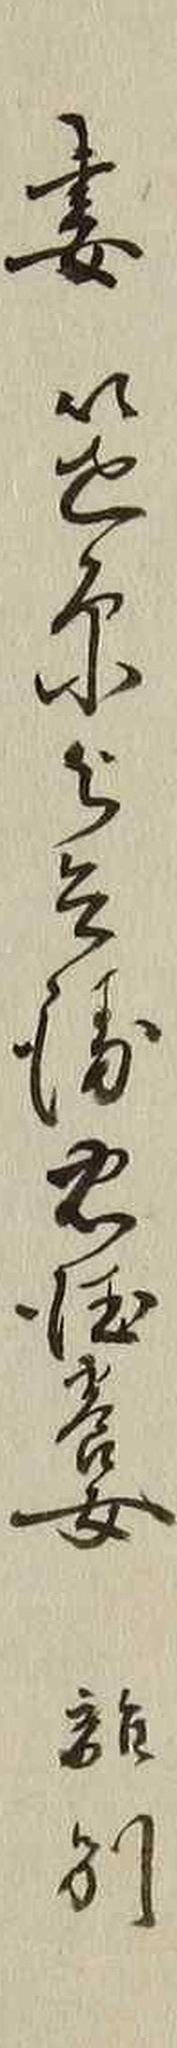妻笹原与兵衛忠徳養女離別
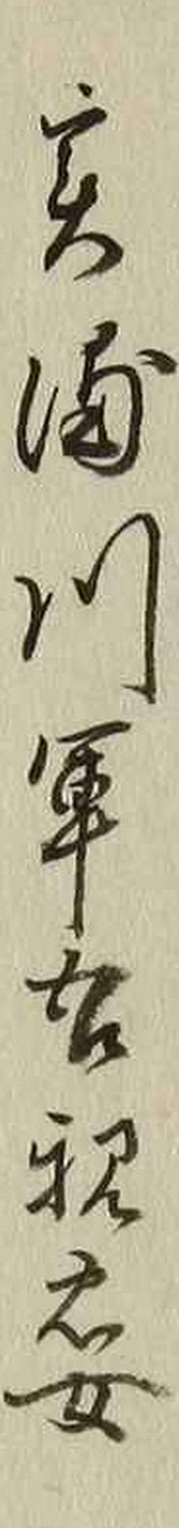実浦川軍吾親忠女
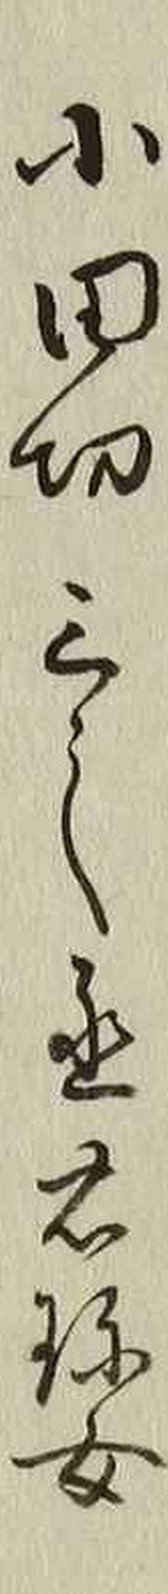小田切三之丞忠珍女
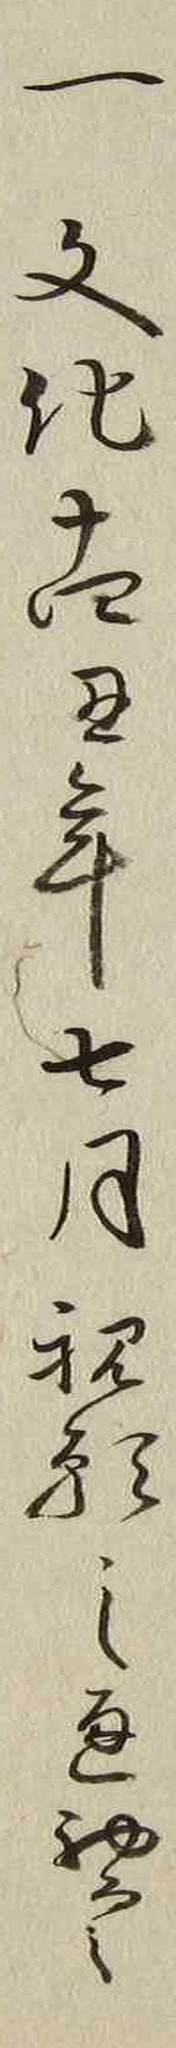一文化十四丑年七月親願之通初而之
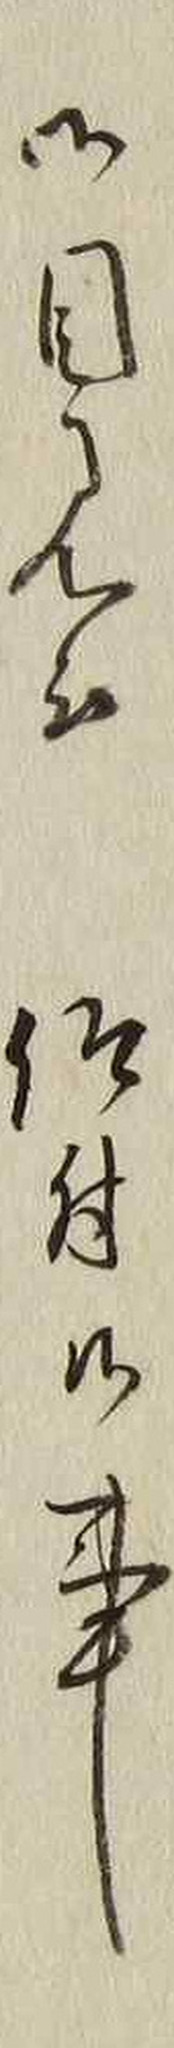御目見被仰付候事
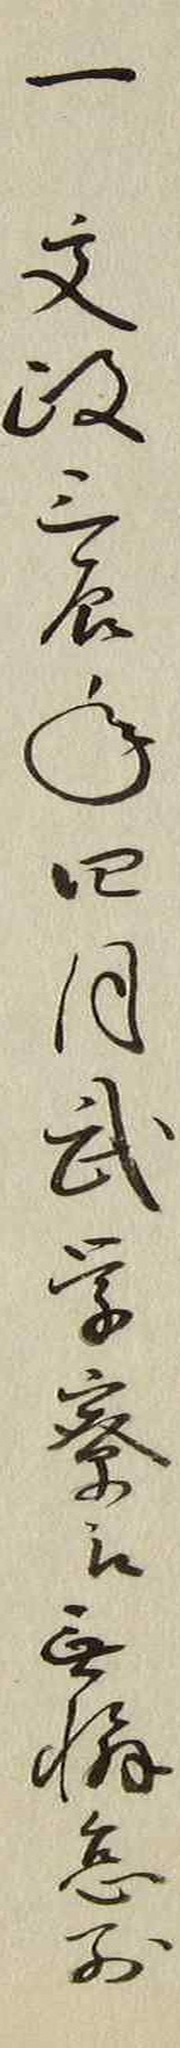一文政三辰年四月武学寮江無懈怠別
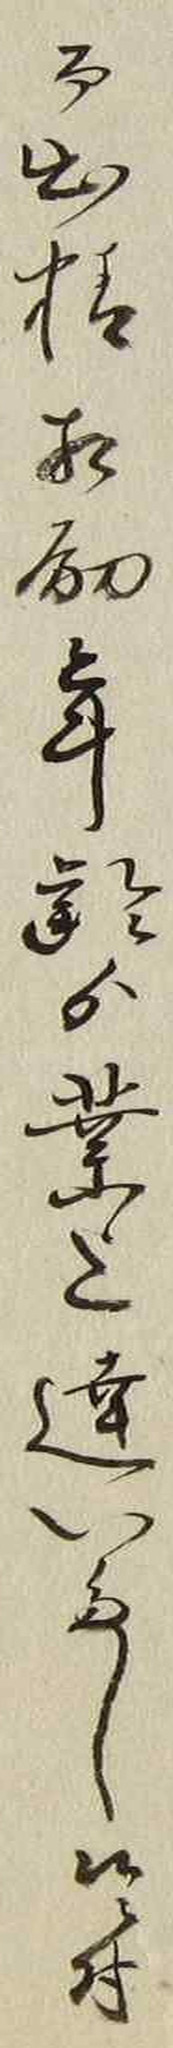而出精相励年齢ゟ業上達いたし候に付
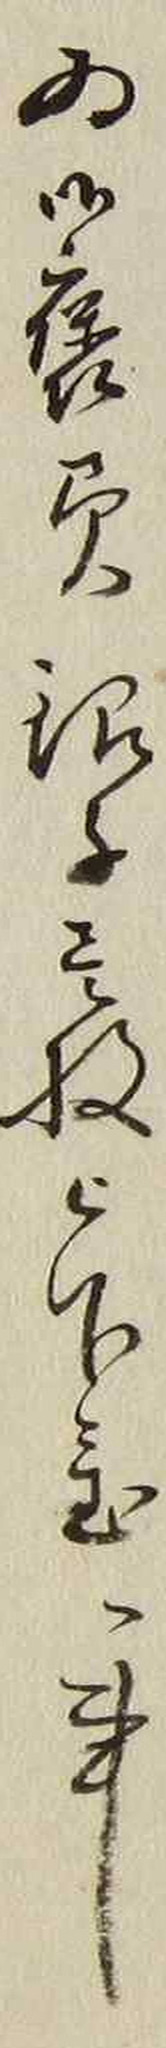為御褒美銀子壱枚被下置候事
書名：諸士系譜　巻之3　い之部3
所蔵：会津若松市立会津図書館
